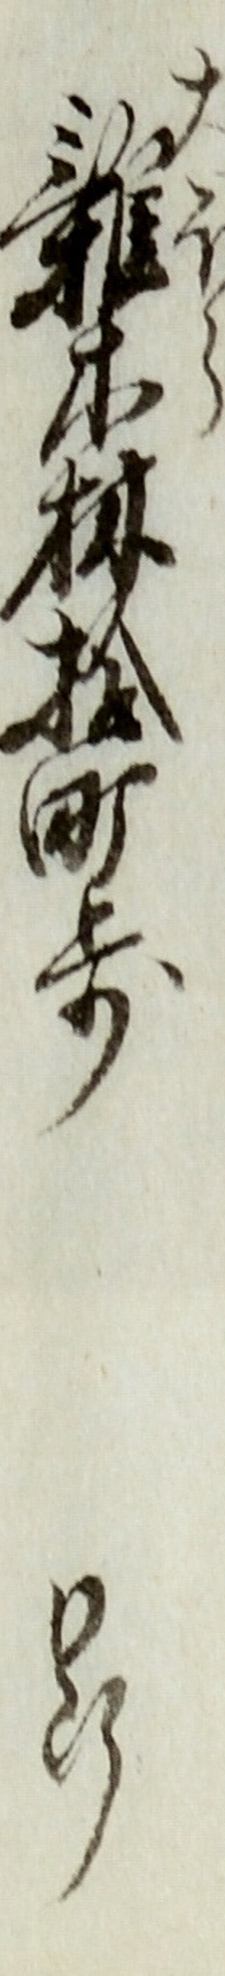雑木林拾町歩同断
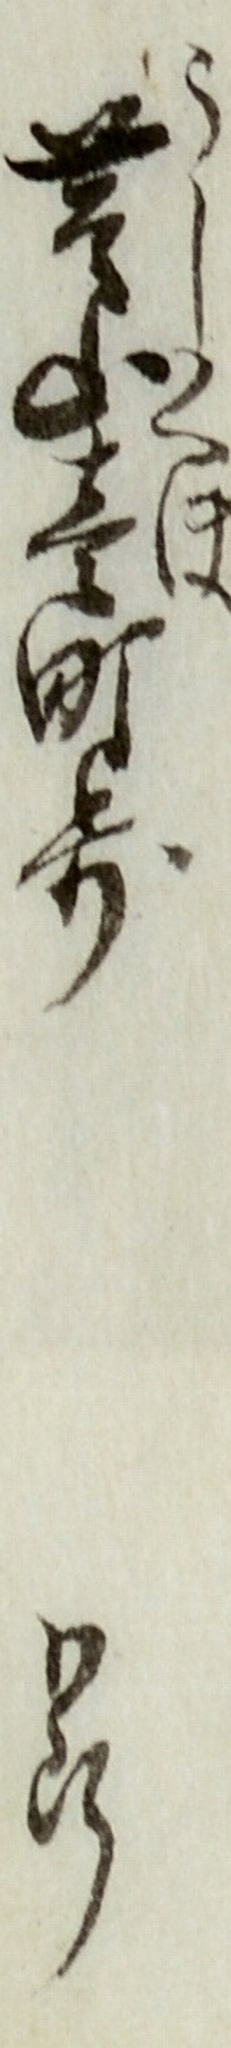芝山壱町歩同断
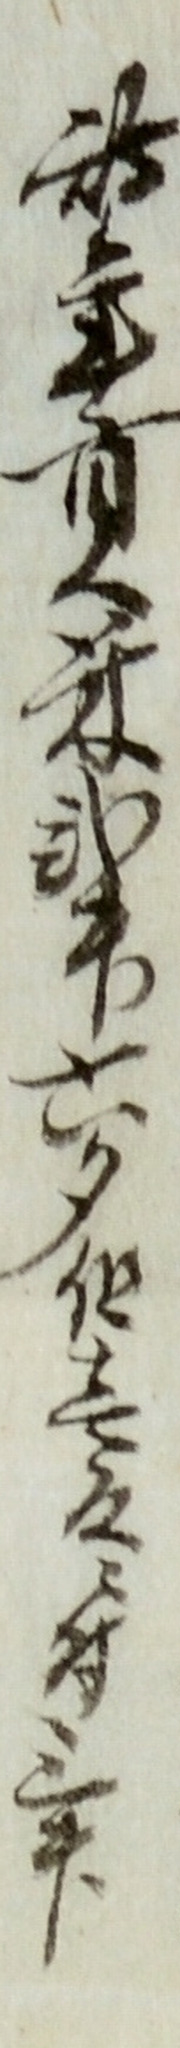此年貢米弐升六勺但壱反ニ付三升

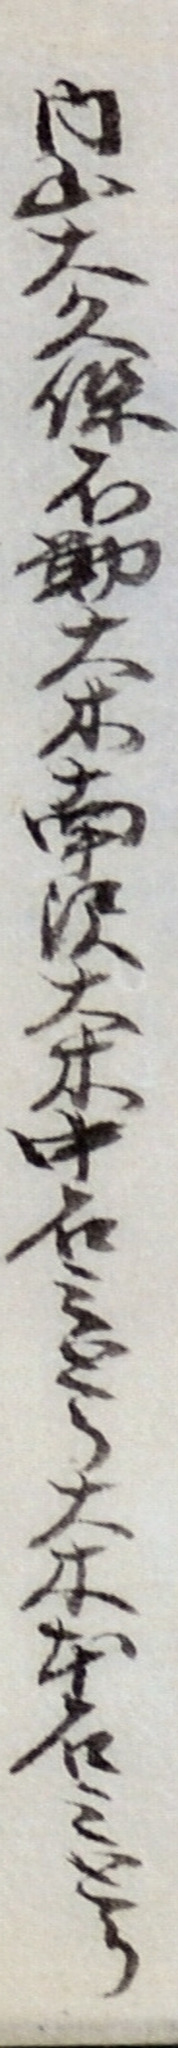内山大久保不勤大木南沢大木中石みとう大木本石みとう
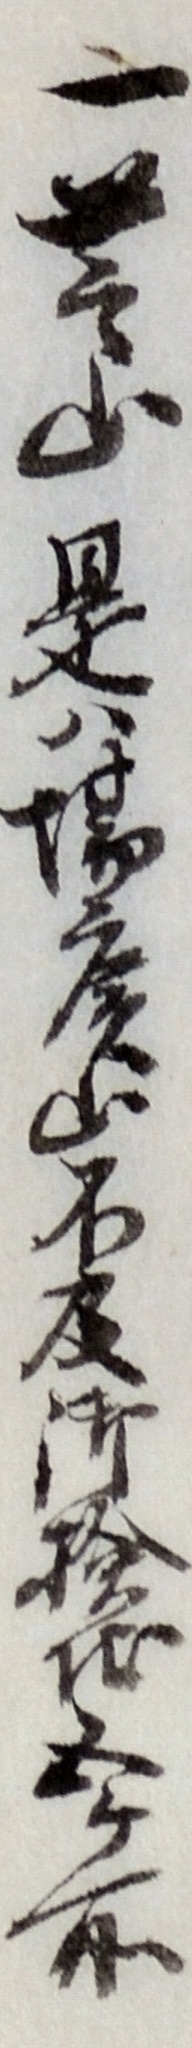一芝山是ハ場広山不及御検地五ケ所
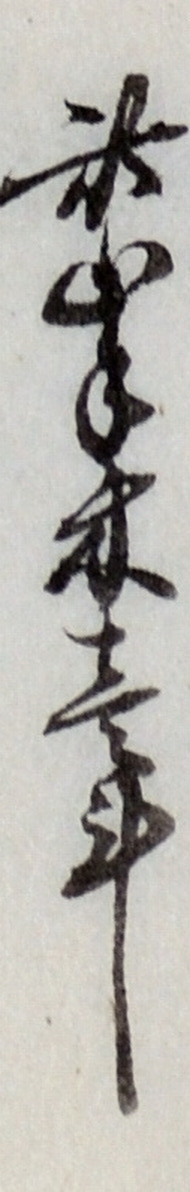此山手米壱斗
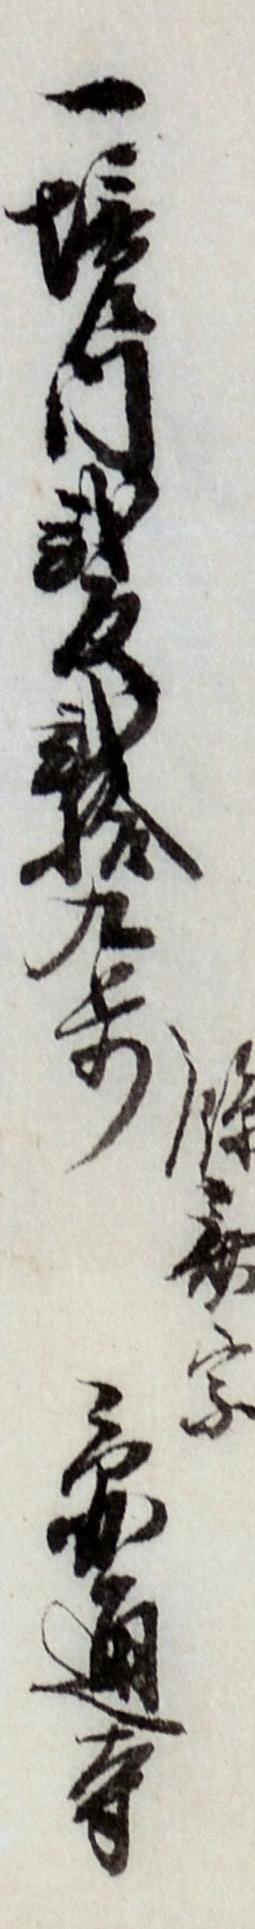一境内弐反弐拾九歩円通寺
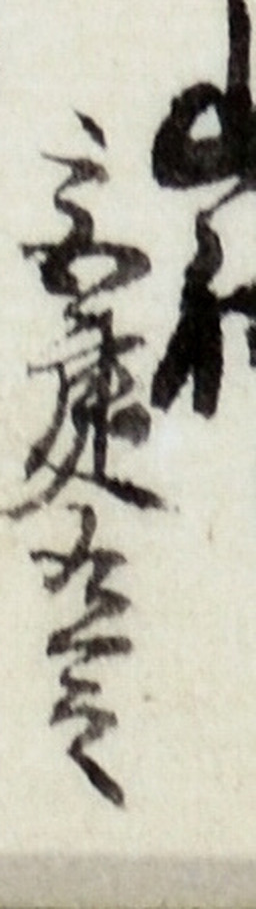宮建有之
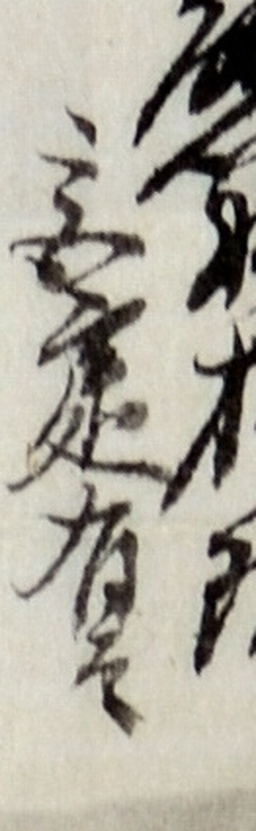宮建有之
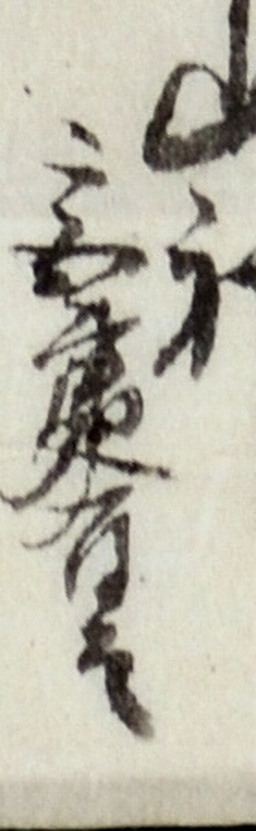宮建有之
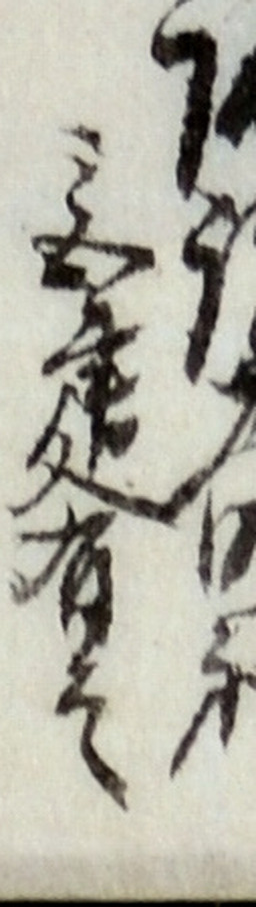宮建有之
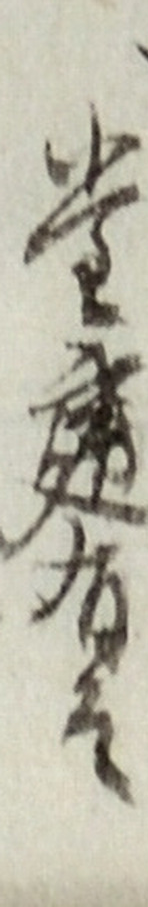堂建有之
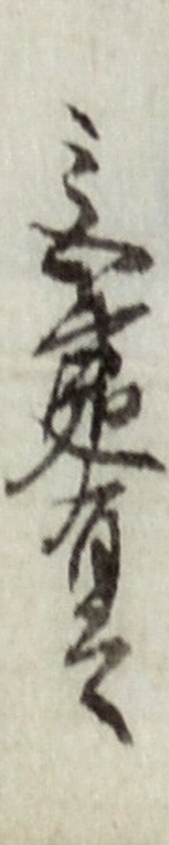宮建有之
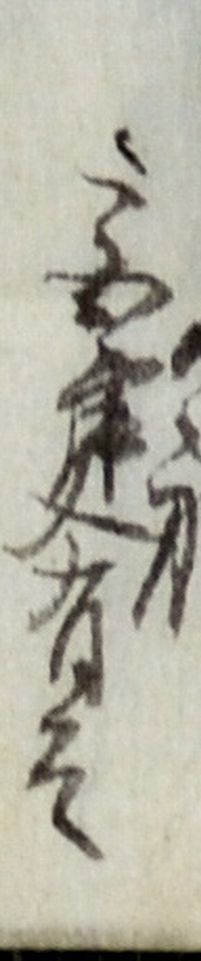宮建有之
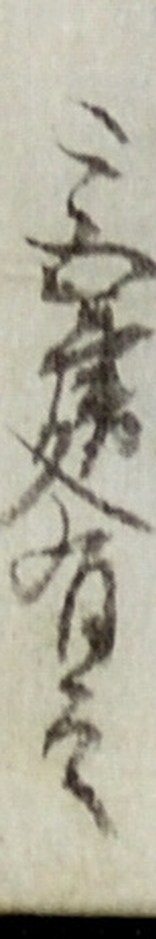宮建有之

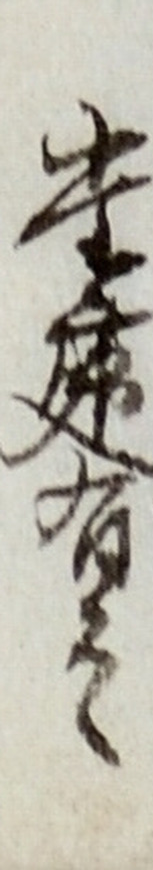堂建有之
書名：御領分中山林社地手控
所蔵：伊那市立高遠町図書館・合同会社AMANE
